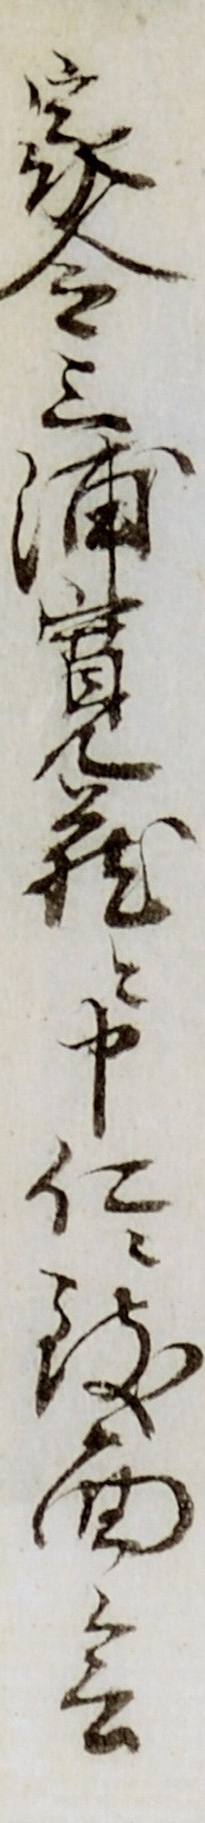家令三浦寛蔵と申仁に致面会
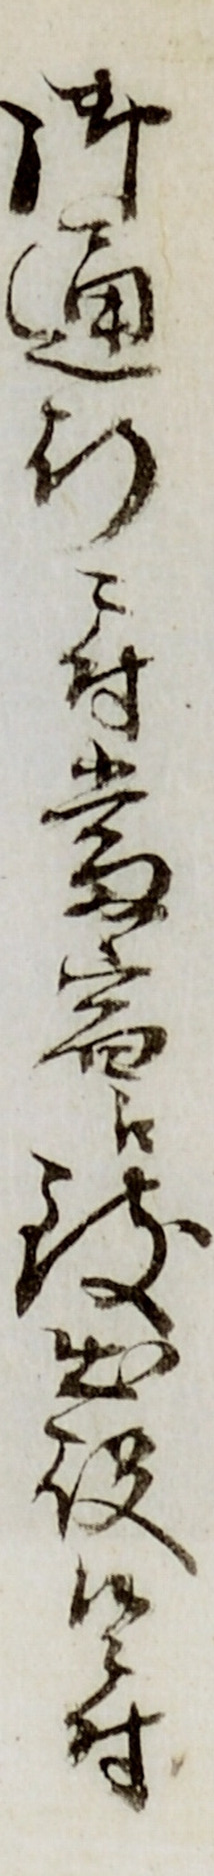御通行に付当宿え致出役候に付
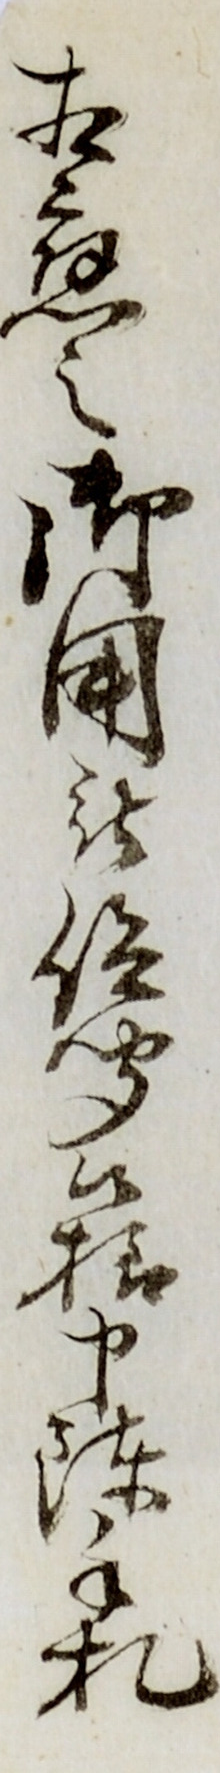相応之御用被仰聞候様申陳手札
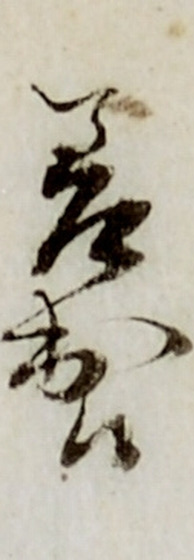差出候
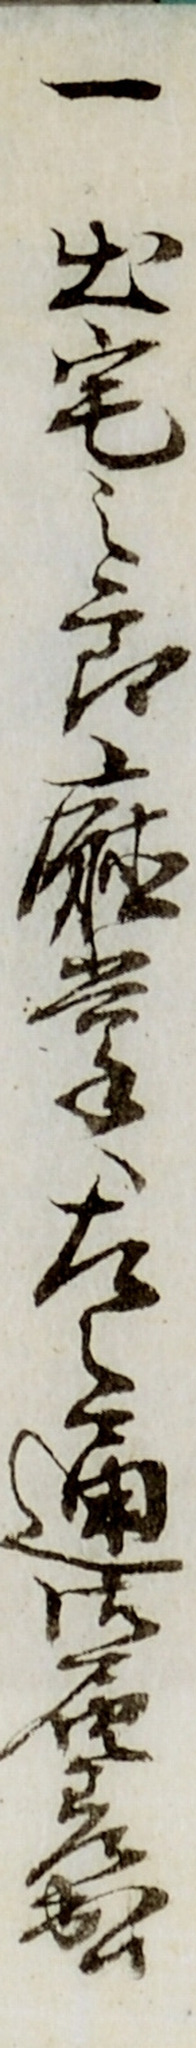一出宅之節庁掌へ左之通御届差出候
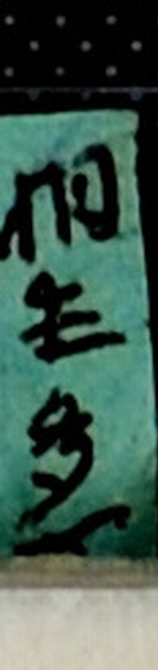差出候
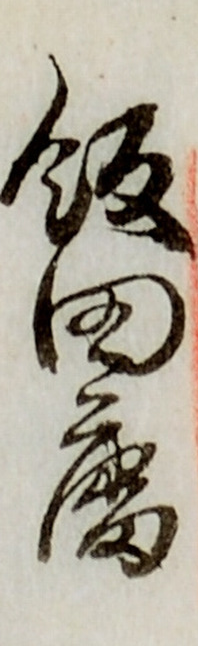飯田藩
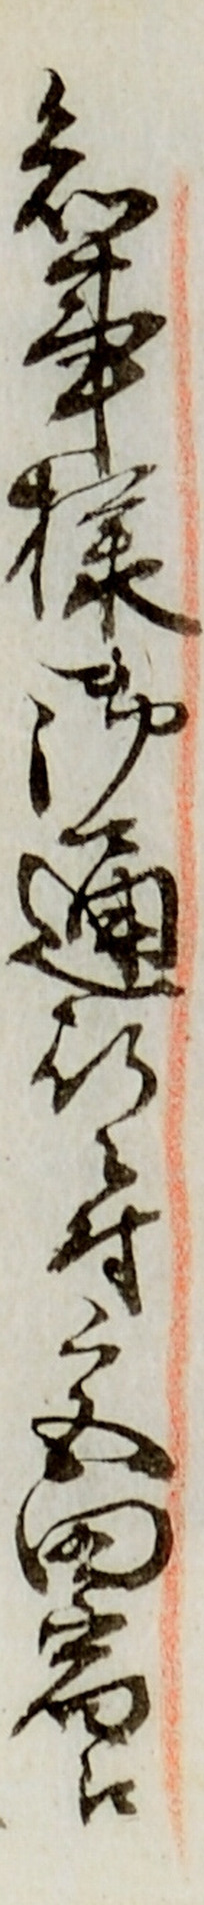知事様御通行に付宮田宿え
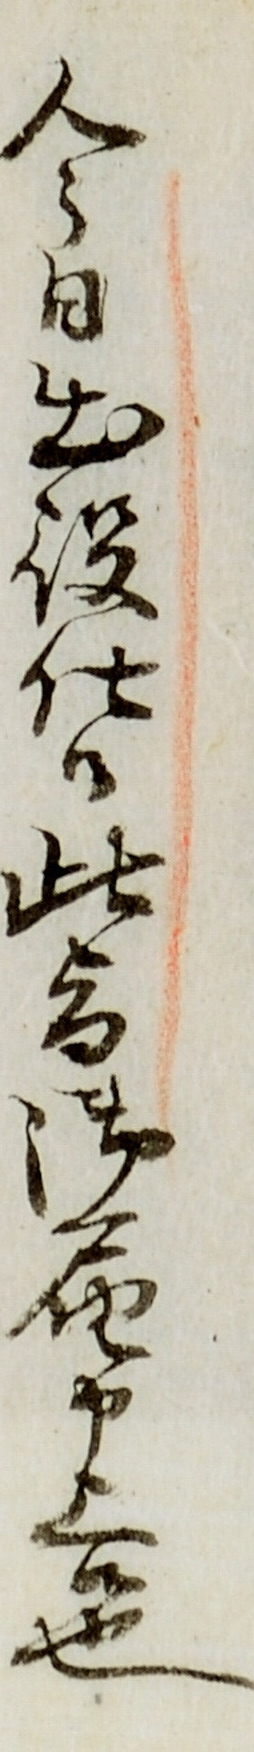今日出役仕候此旨御届申上候也
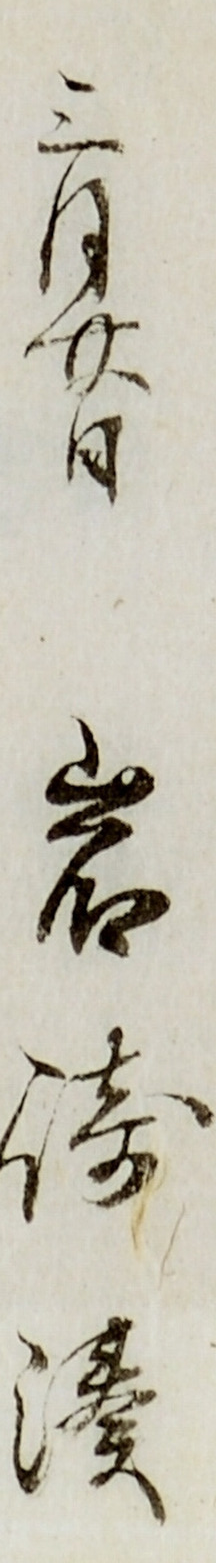三月廿日岩崎湊
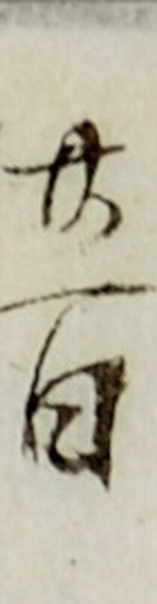廿一日
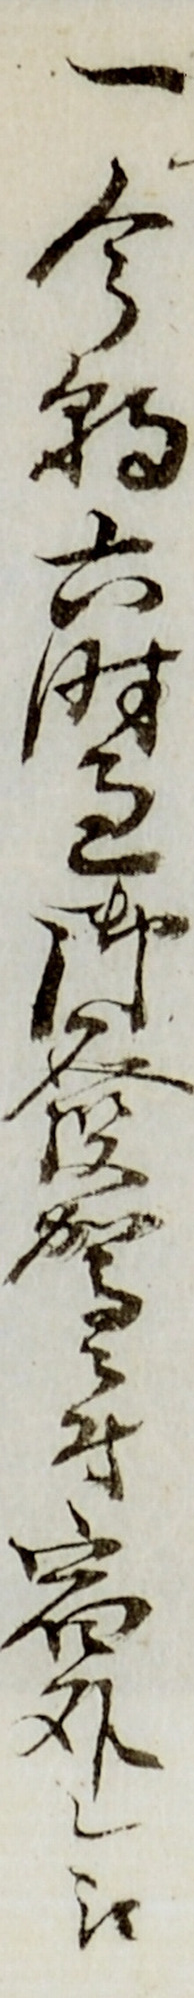一今朝六時過御発駕に付宿外レえ
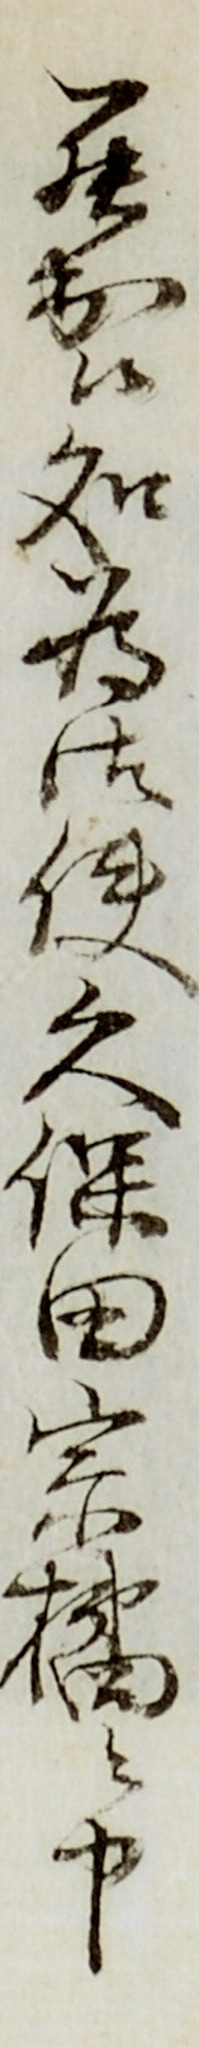罷出候処為御使久保田宗橘と申
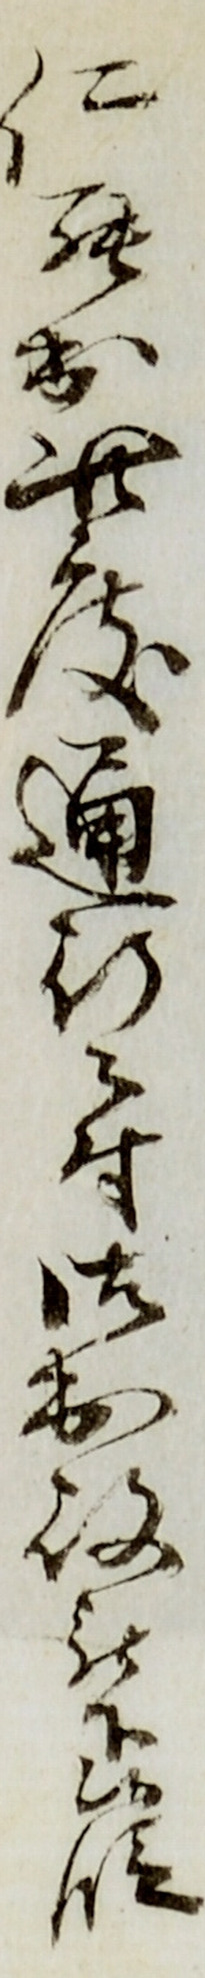仁罷出此度通行に付御出役被下候段
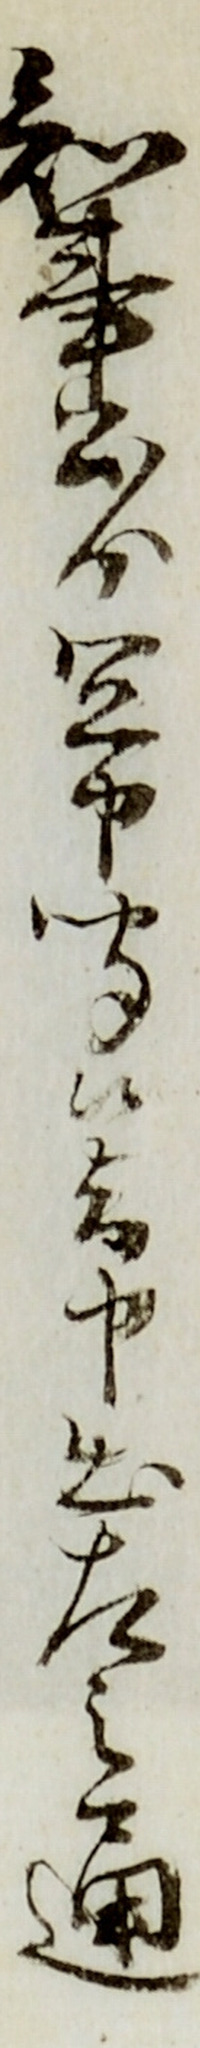知事公ゟ宜申聞候旨申付左之通
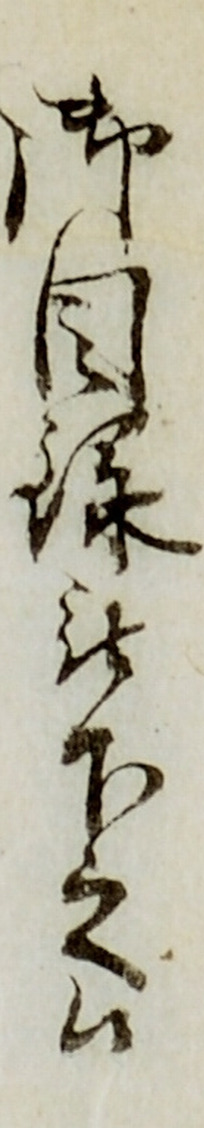御目録被下之候
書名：山林方諸事御用留
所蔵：伊那市立高遠町図書館・合同会社AMANE
